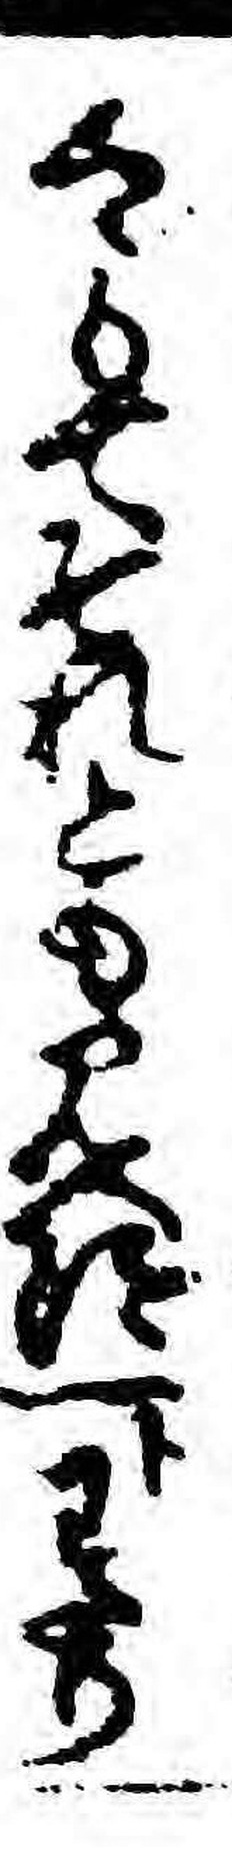くゞりてそれとも見へず一トわたり
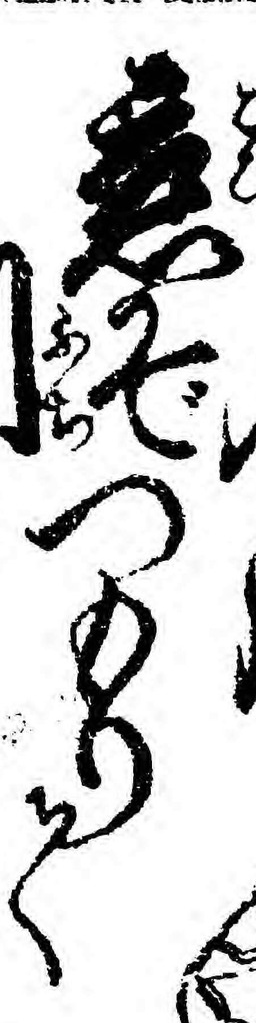恋ぞつもりて
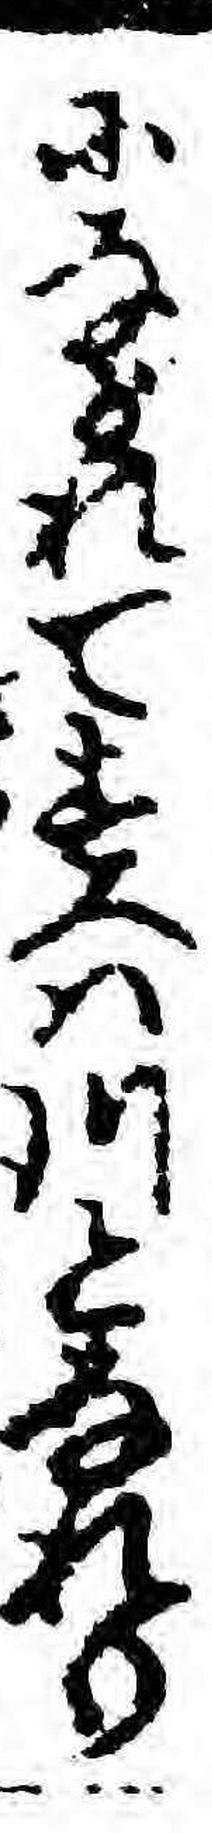にながれてすへは川となれり
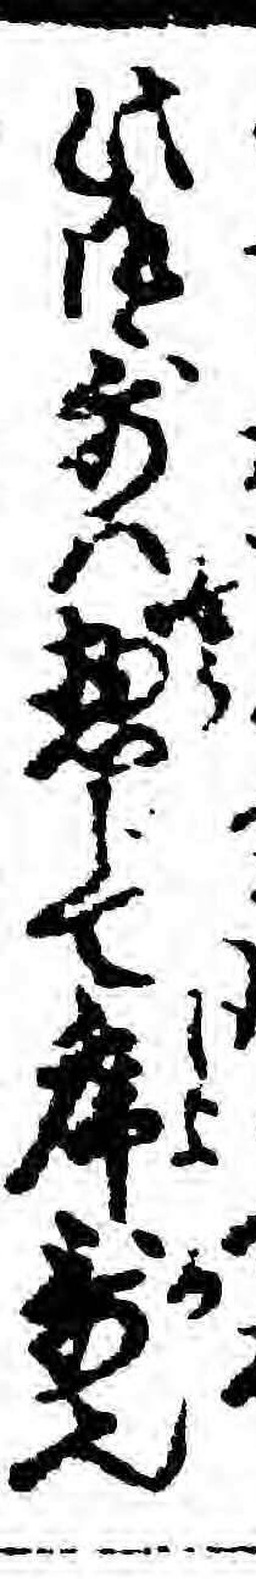此御哥は惣じて序哥也
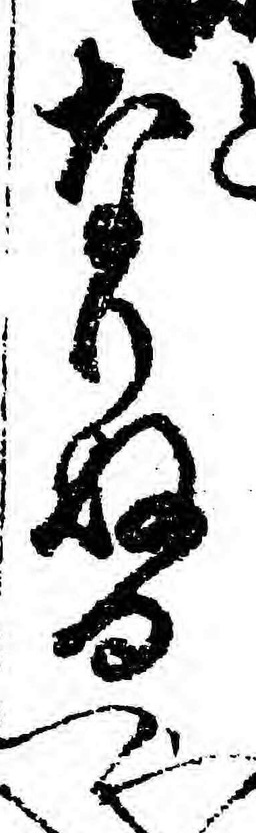なりぬる

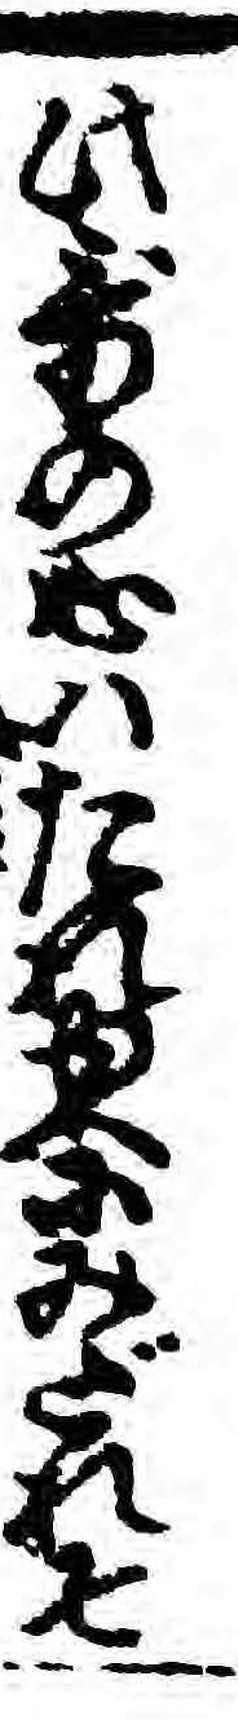此哥の心はたれゆへにみだれそ
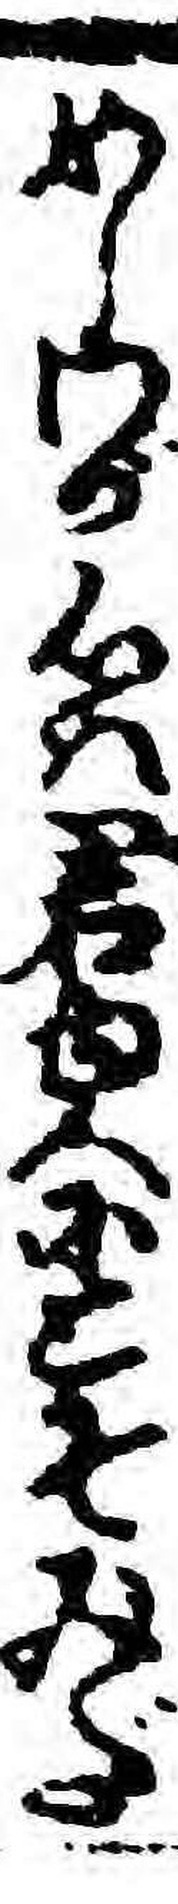めしわが心は君ゆへにこそみだ
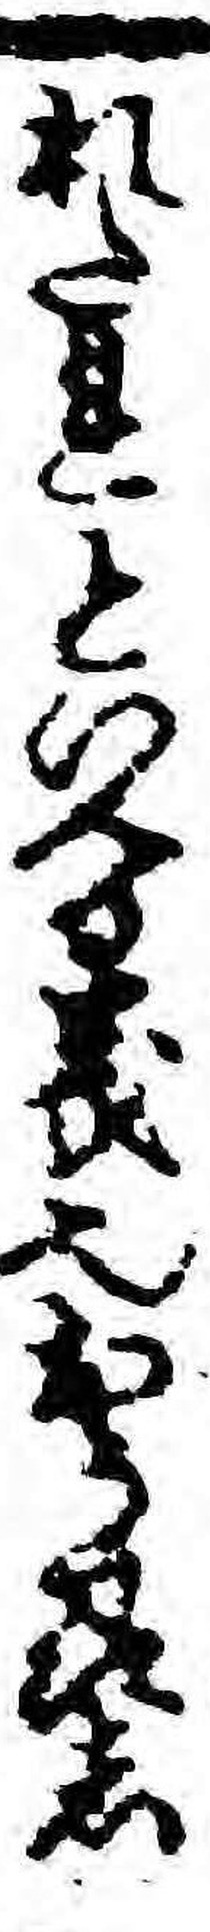れたれといへる義也おう州し
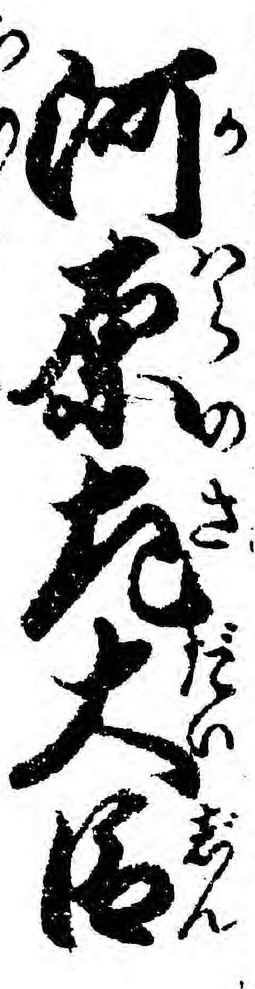河原左大臣
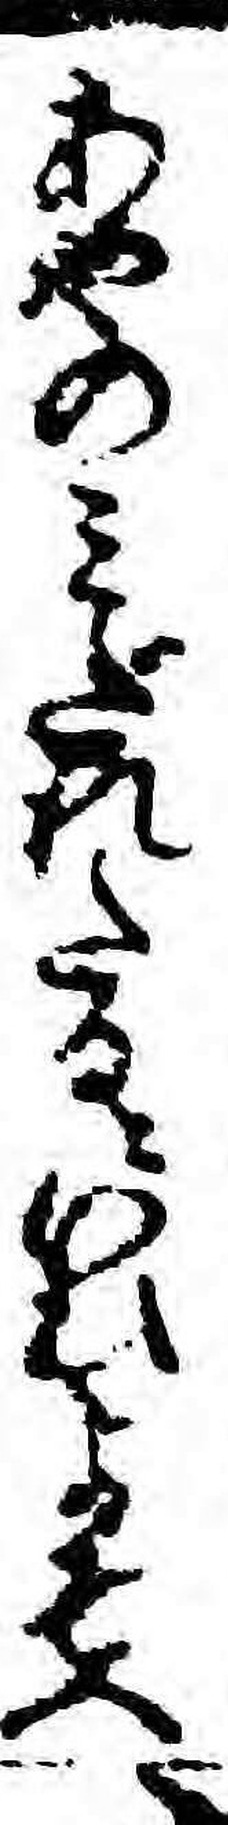あやのみだれたるにいひよそへ
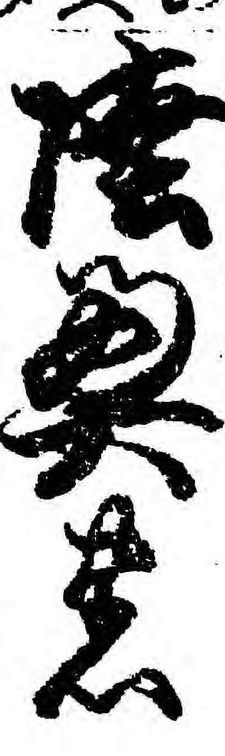陸奥の
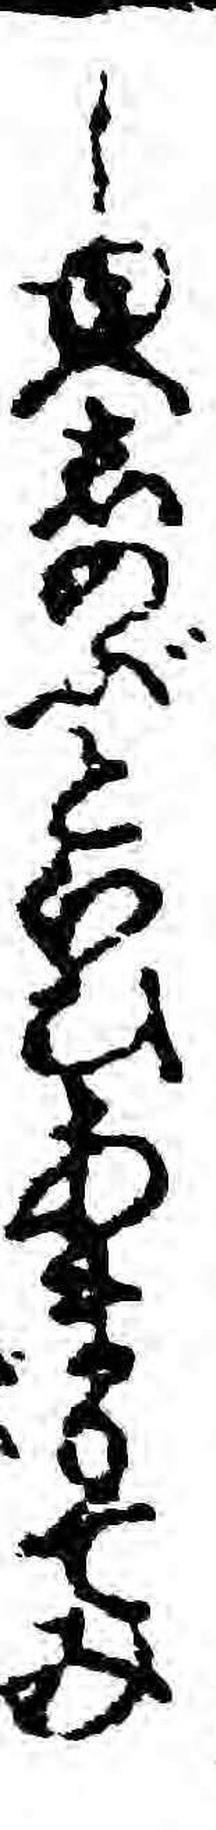しゆへしのぶといひあまりてみ
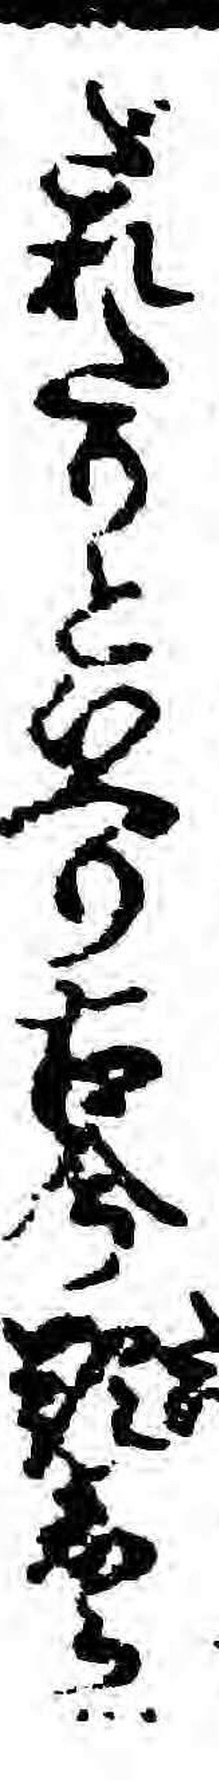だれたりといへり古今題しら
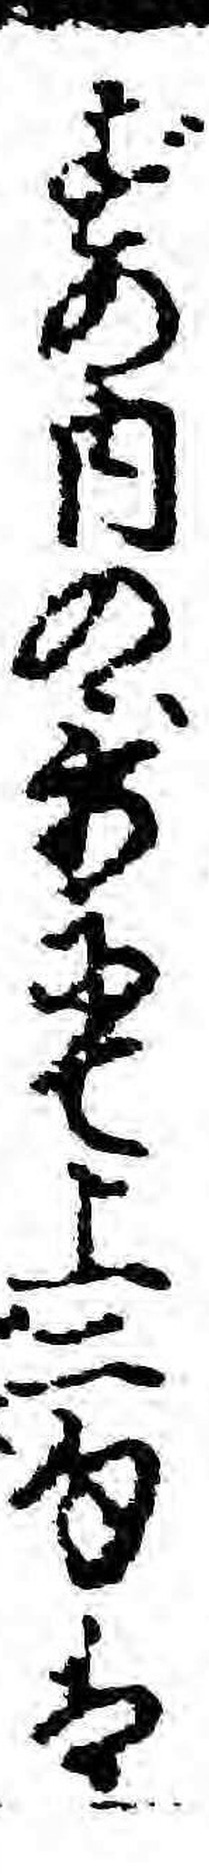ずの内の哥にて上二句は
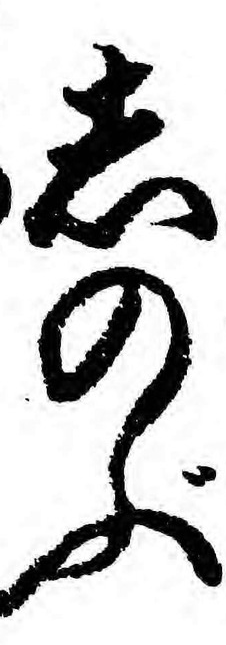しのぶ
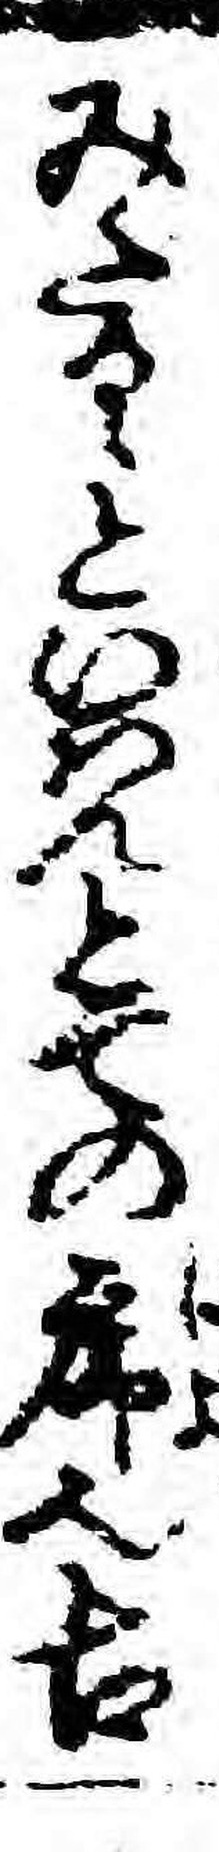みたるゝといはんとての序也古
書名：頭書和歌注譯／壽賀多百人一首小倉錦
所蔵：国文学研究資料館
